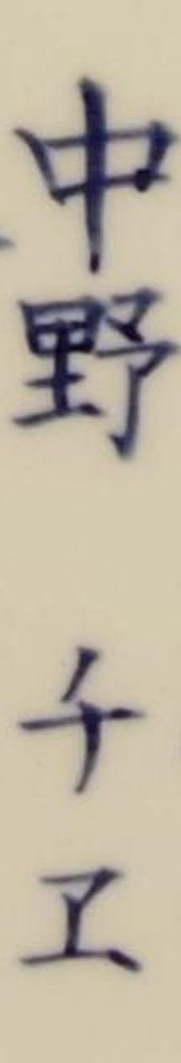中野チヱ
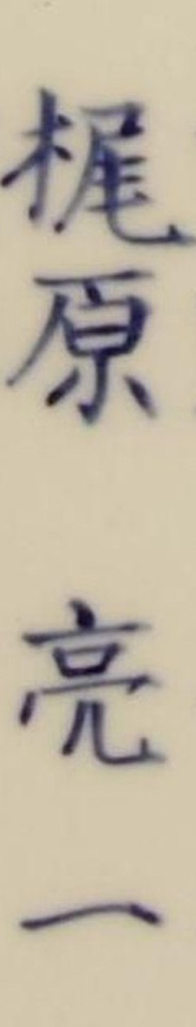梶原亮一
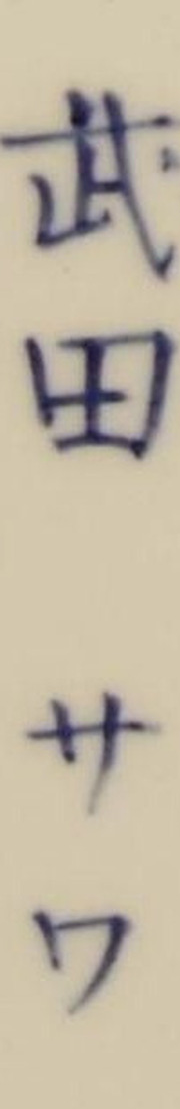武田サワ
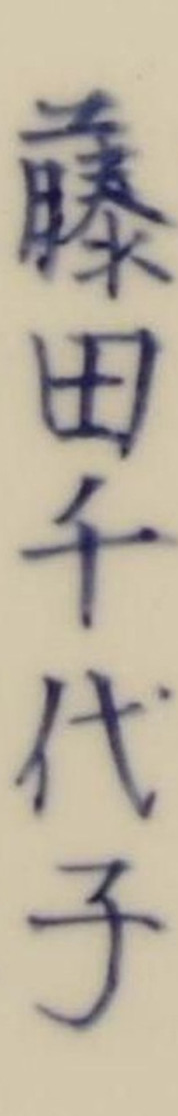藤田千代子
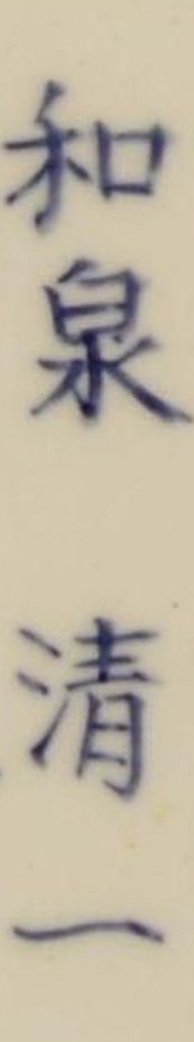和泉清一
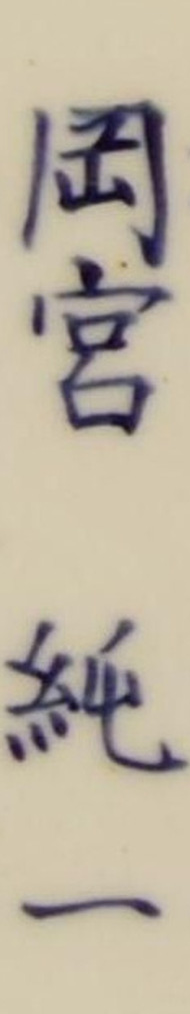岡宮純一
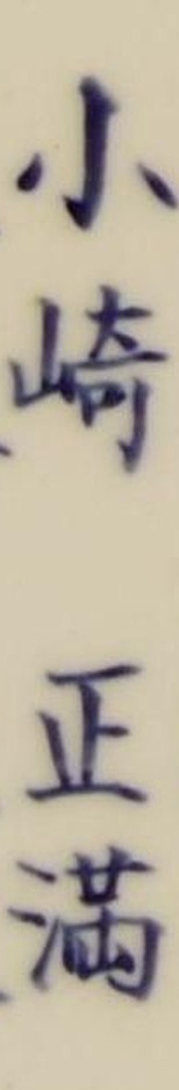小崎正満
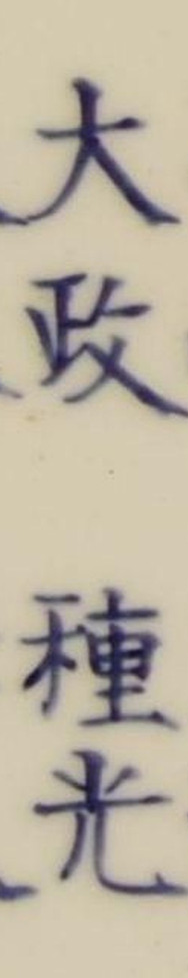大政種光
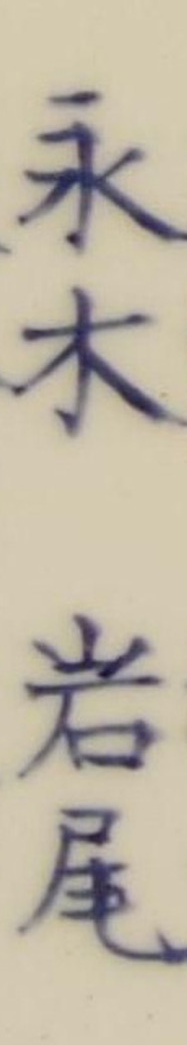永木岩尾
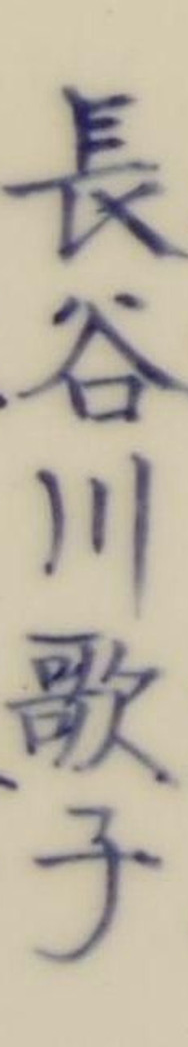長谷川歌子
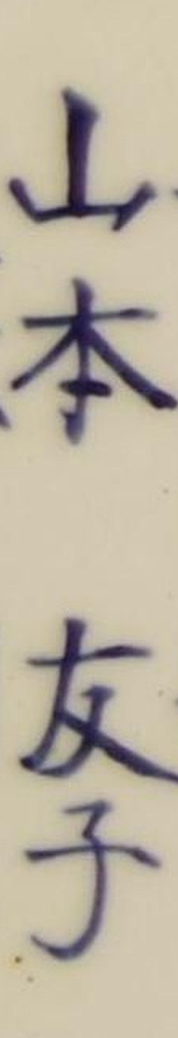山本友子
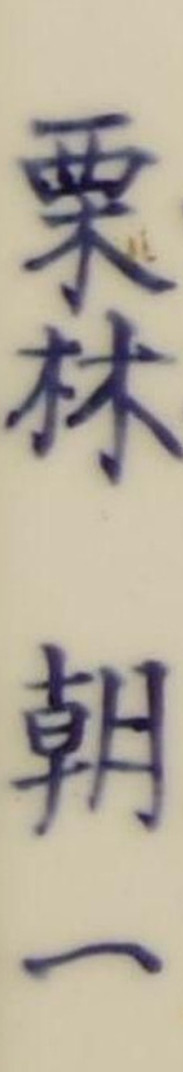栗林朝一

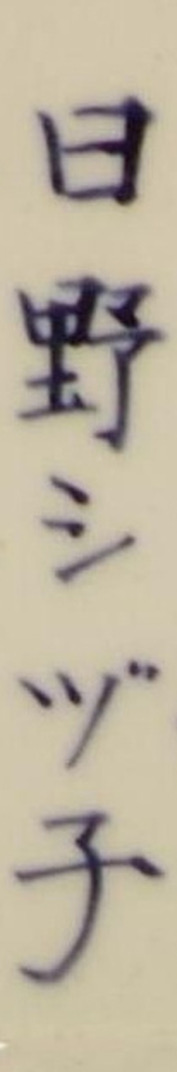日野シヅ子
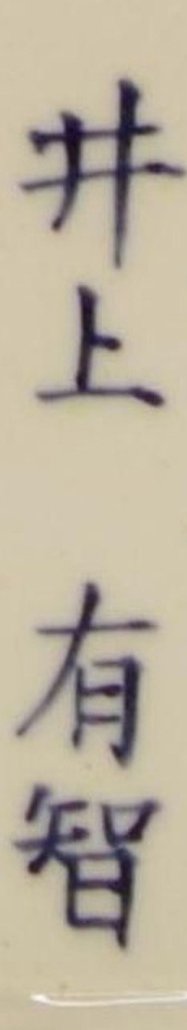井上有智
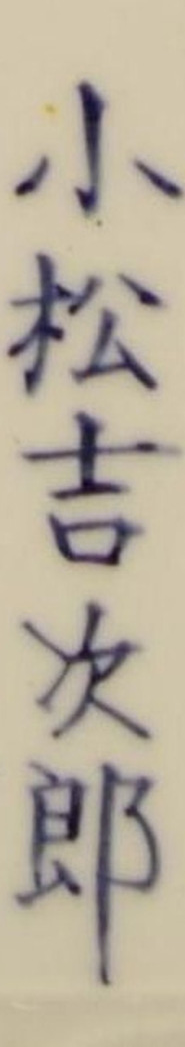小松吉次郎
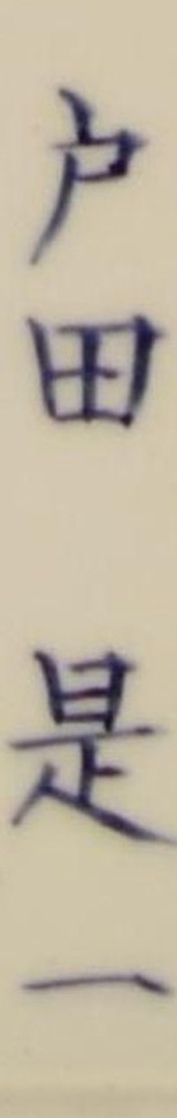戸田是一
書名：E~L
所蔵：高野山金剛峯寺
